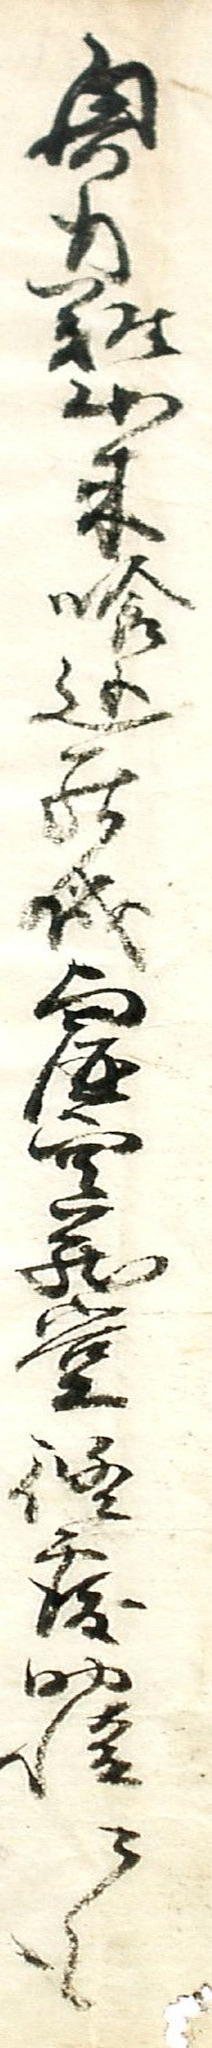興行難出来喰込罷成虚空蔵堂修覆助情ニも
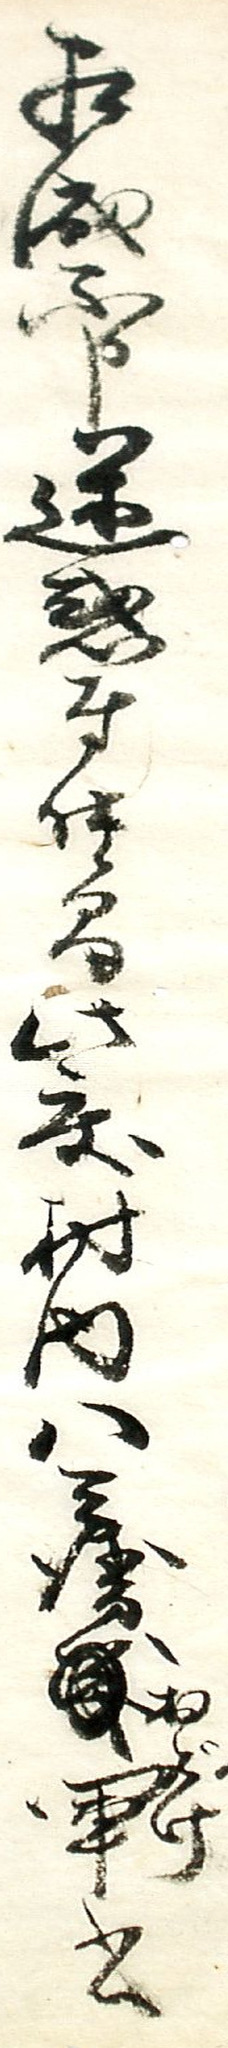相成不申迷惑奉仕候間此度村内八兵衛へおどけ軍書
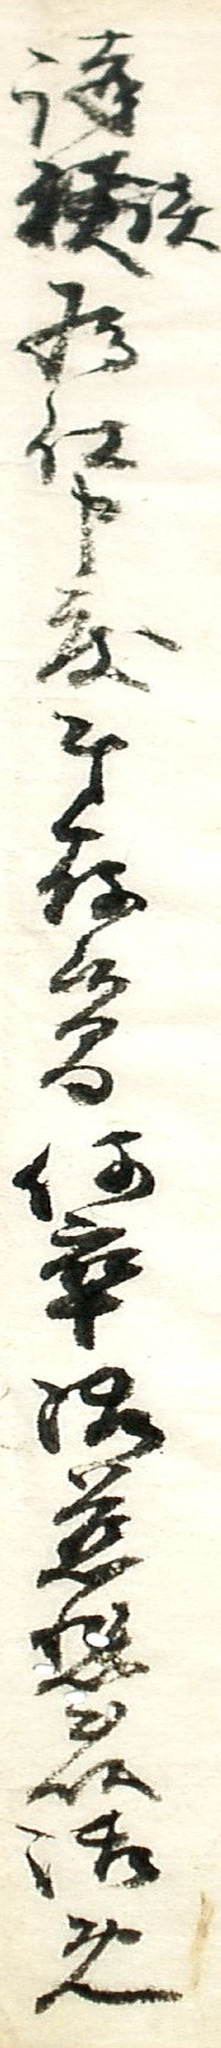講談為仕申度奉存候間何卒御慈悲ヲ以御免
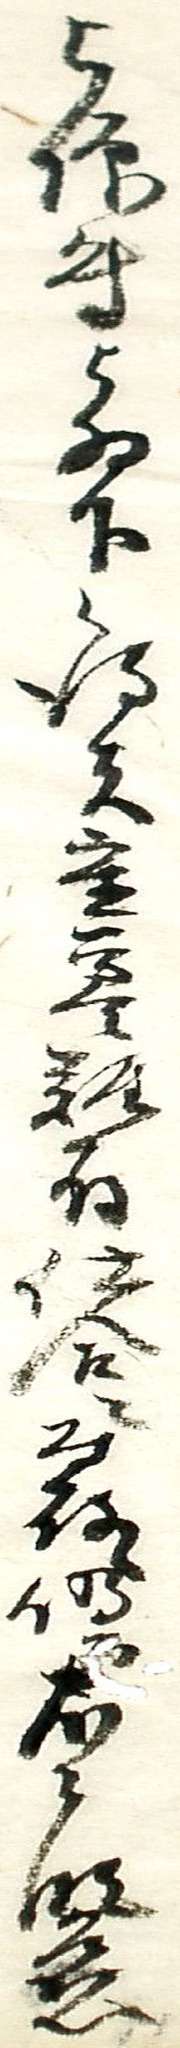被仰付被為下候得者重畳難有仕合ニ奉存候仍而右之段乍恐
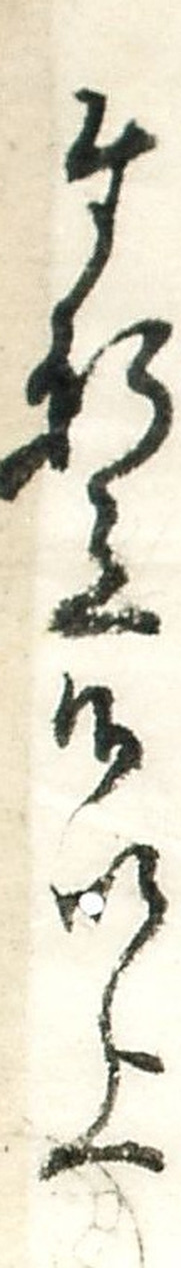奉願上候以上
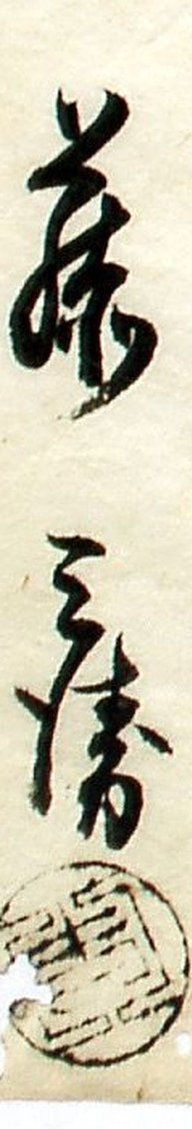藤兵衛
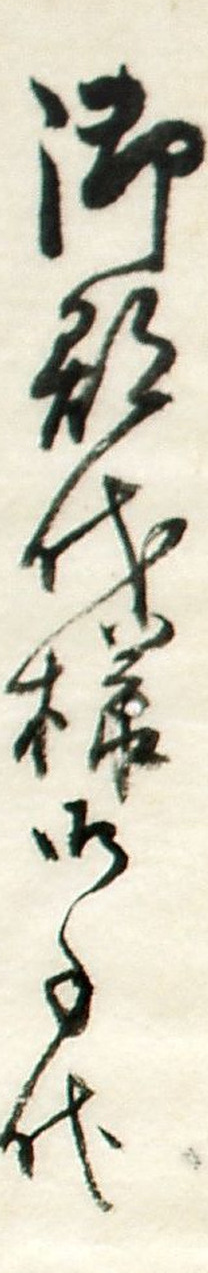御郡代様御手代
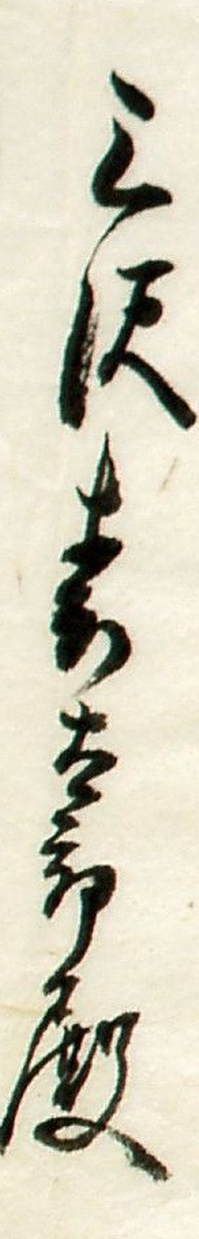三沢春太郎殿
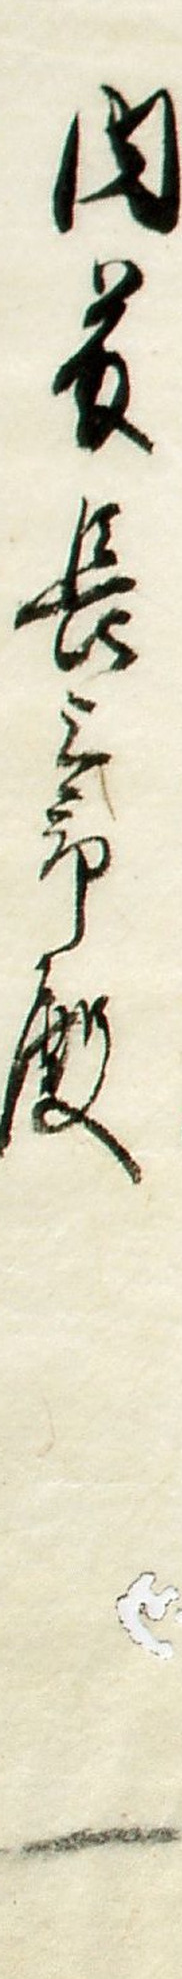内藤長三郎殿
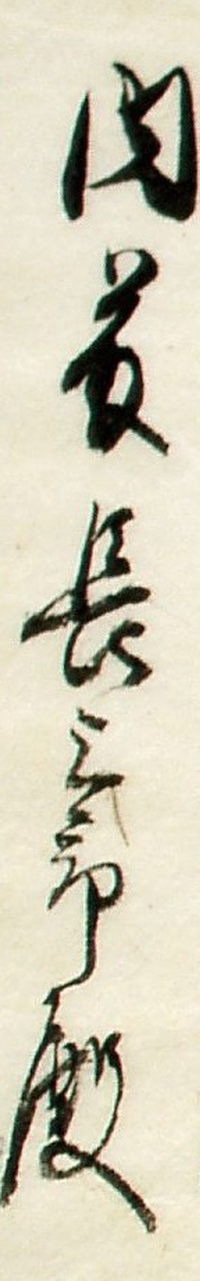内藤長三郎殿
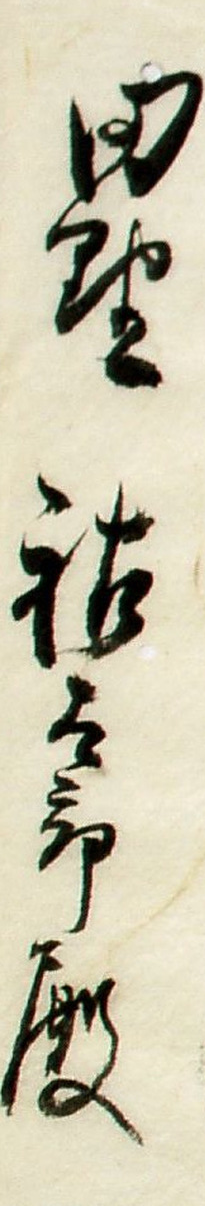田野祐太郎殿
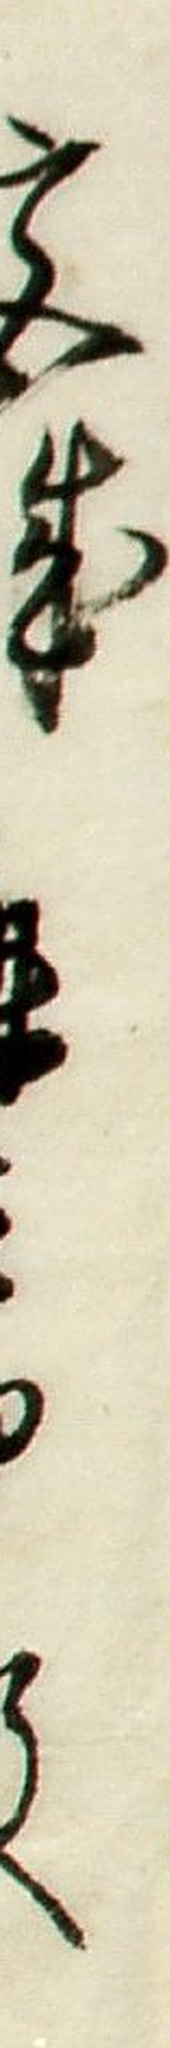宮城麻太郎殿

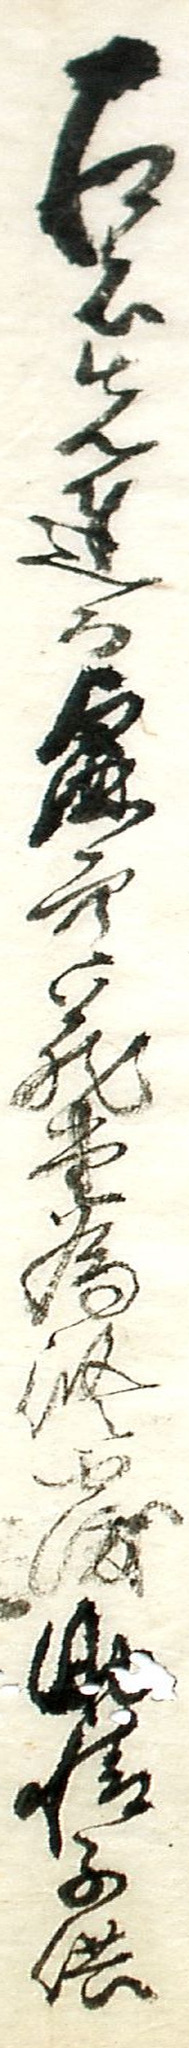右者先達而虚空蔵堂為修覆助情子供
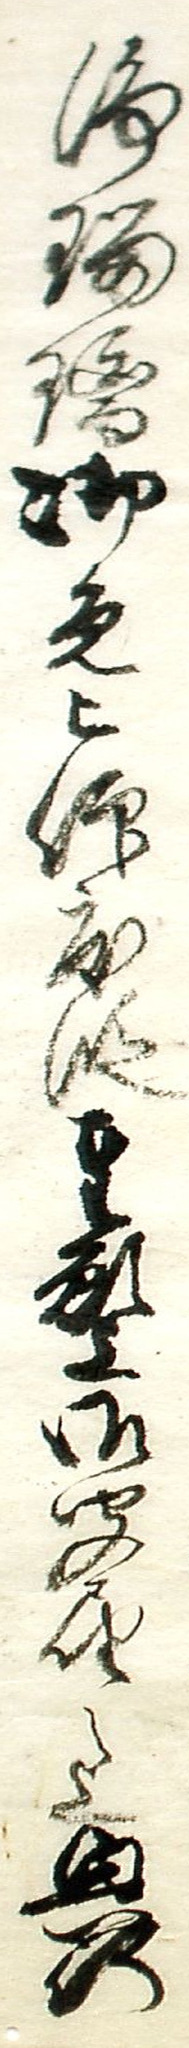浄瑠璃御免被仰度段奉願上御聞届之上興行
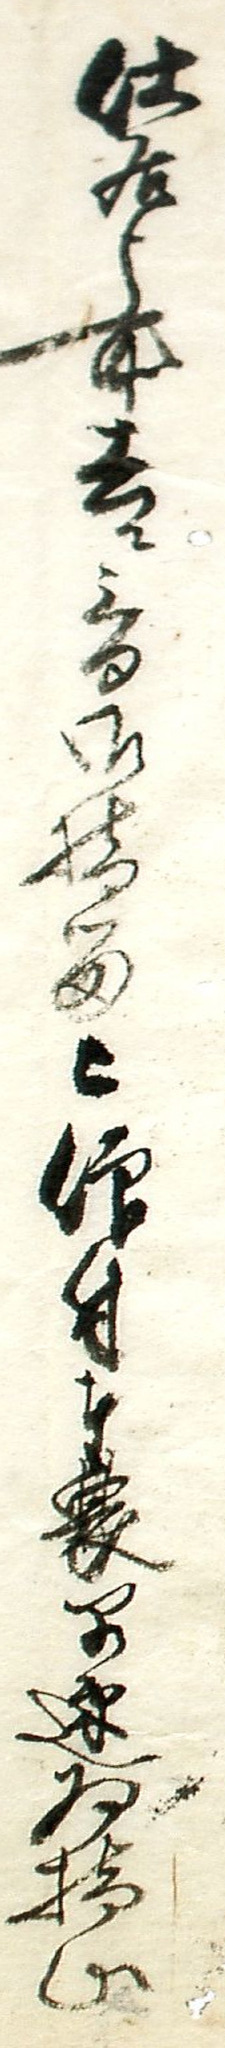仕居申所去ル三日御指留被仰付奉畏早速為指止
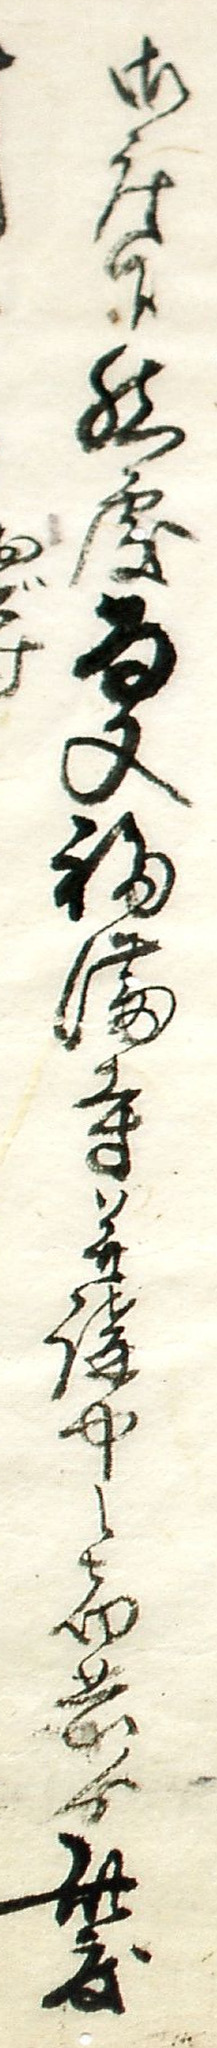御座候然處尚又福満寺幷講中之者共ゟ此度
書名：(早渕村福満寺子ども浄瑠璃願紙面）他
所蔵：鳴門教育大学 Naruto University of Education
